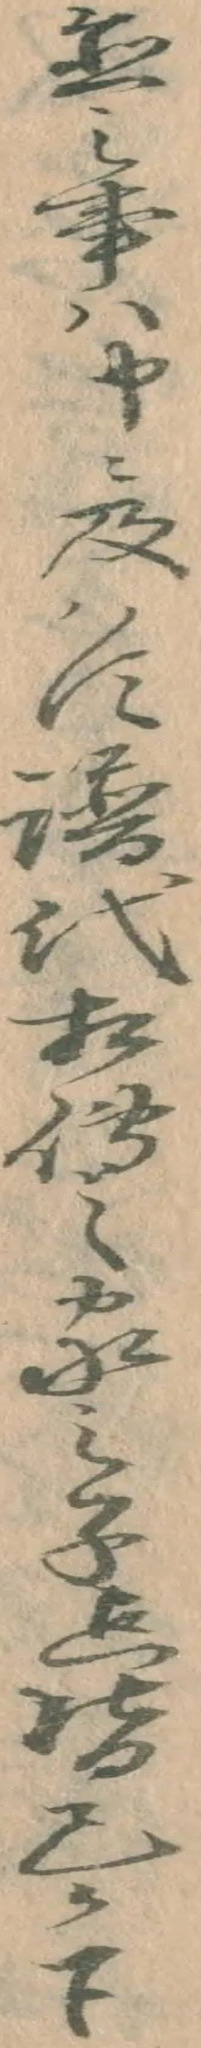置之事は申に及はす譜代相伝之家之子迄皆己か下
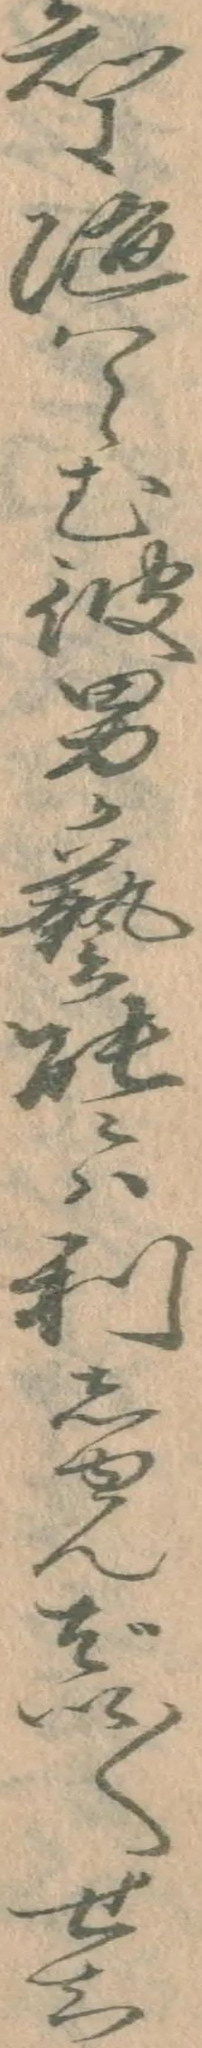知に随はしむ彼男か芸能には利しゆんばい〳〵せち
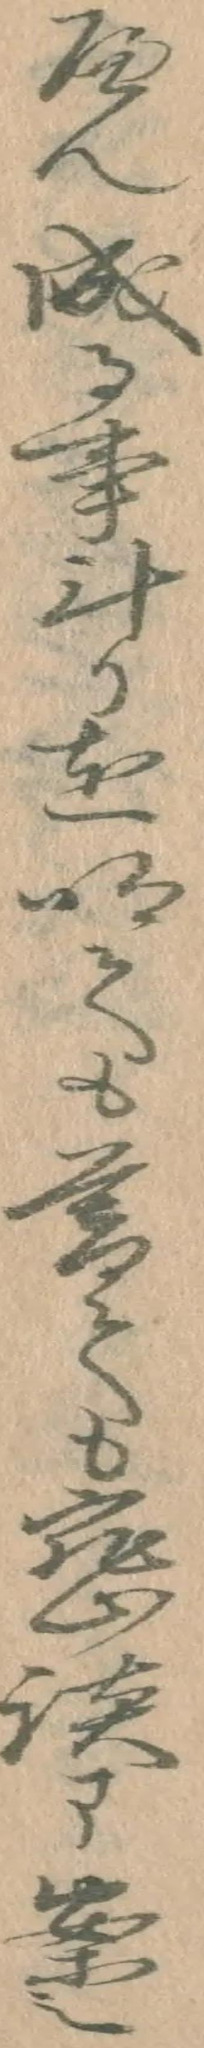へん成る事斗りを明ても暮ても密談す案之
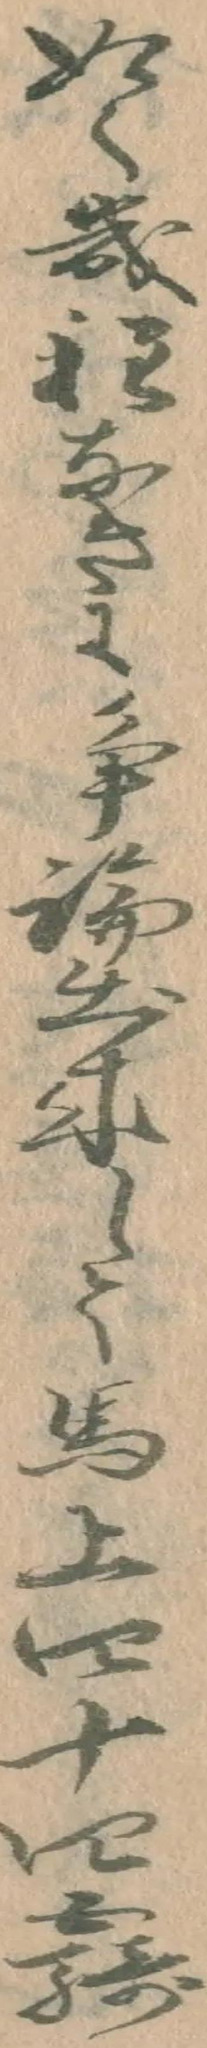如く幾程なきに争論出来して馬上四十四五騎
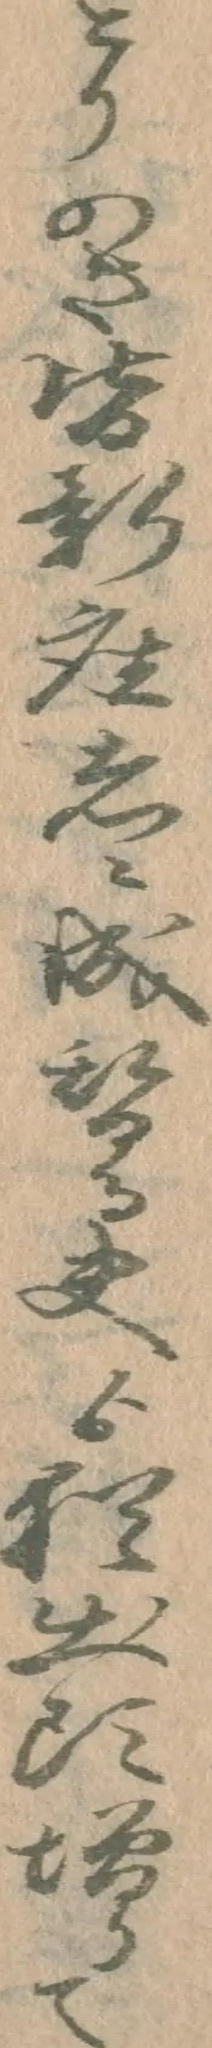とりのき皆新座者に成替る夫ゟ猶出頭増りて
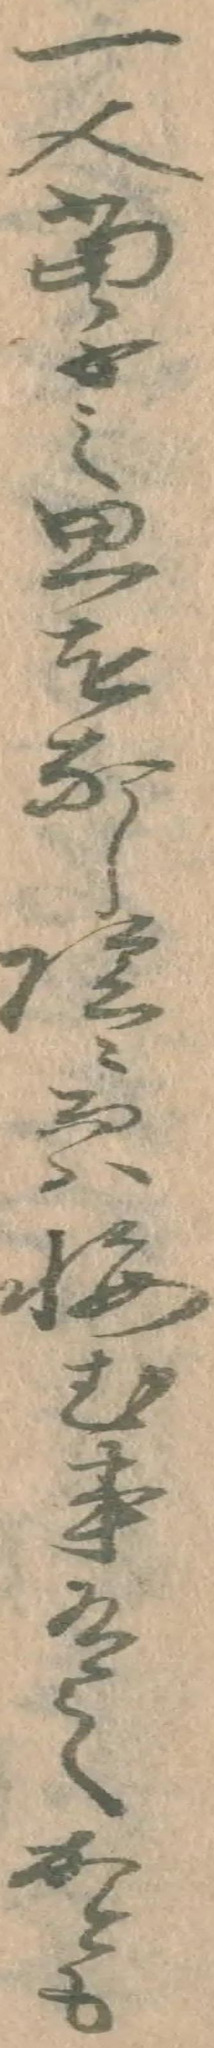一人当千之思をなし陰に而は悔む事有てかとも
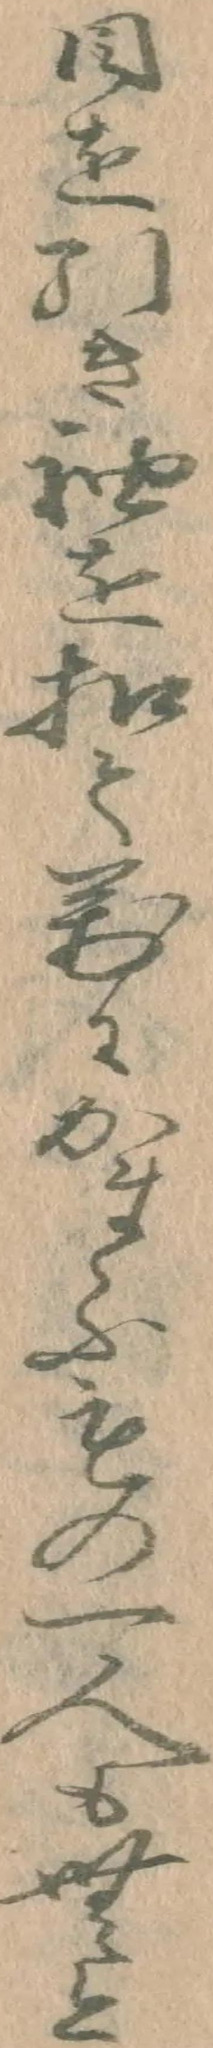目を引き袖を扣て万にかまふもの一人も無と
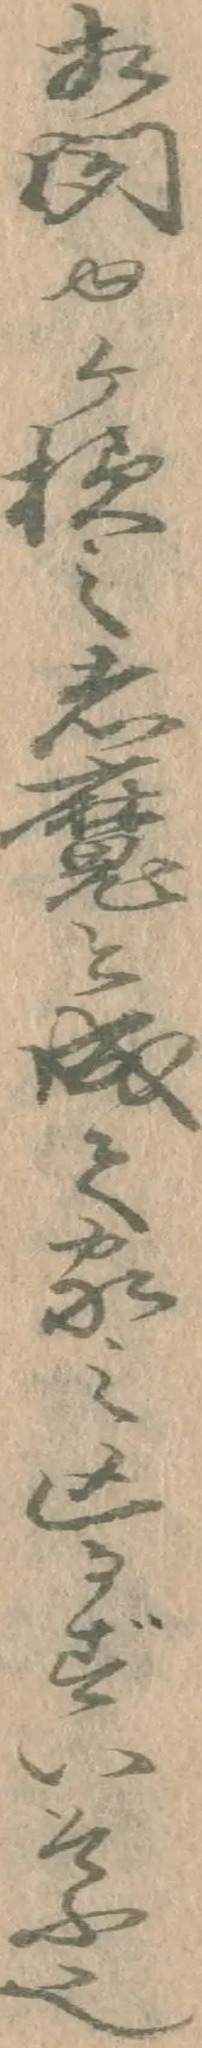相聞由ケ様之者魔と成て家之凶るずいそふ也
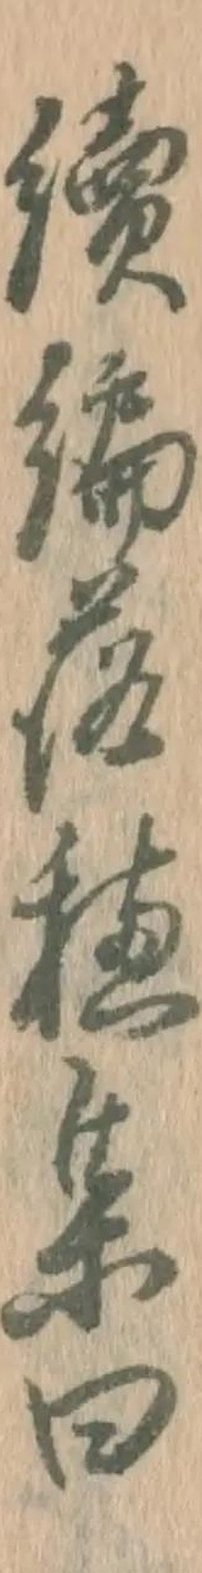続編落穂集曰
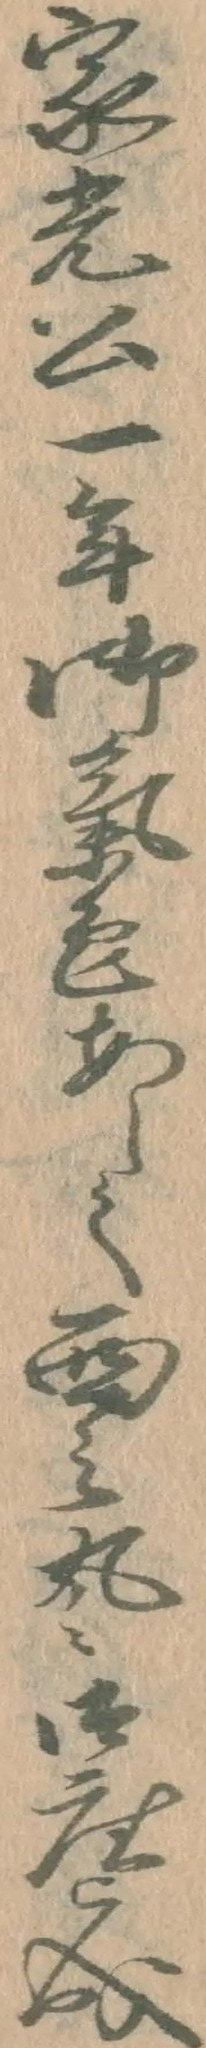家光公一年御気色あして西之丸に御座被成
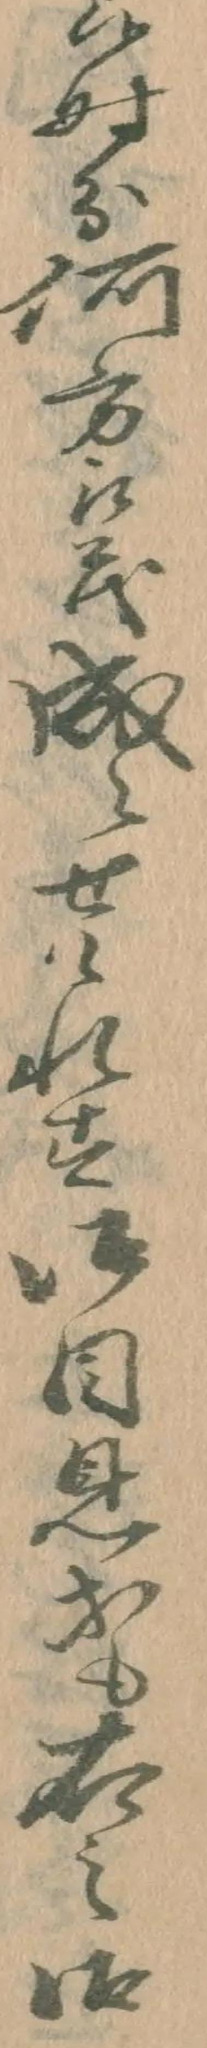候時分何方えも成らせけれす御目見等も右之御
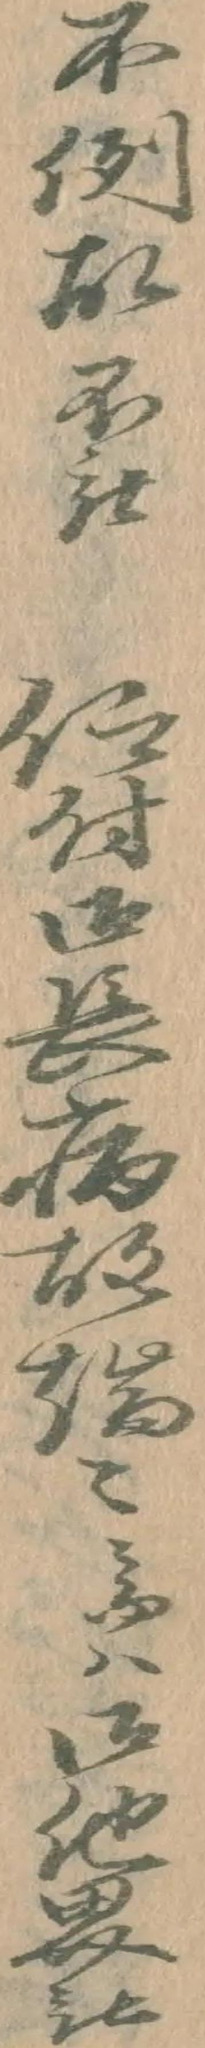不例故不被仰付御長病故端々に而は御他界被
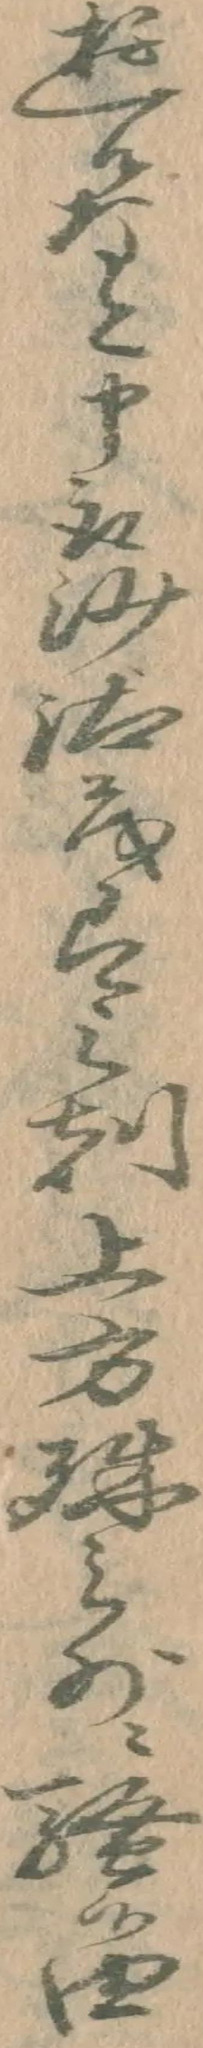遊候なと申取沙汰も艮之刻上方殊之外に騒候由
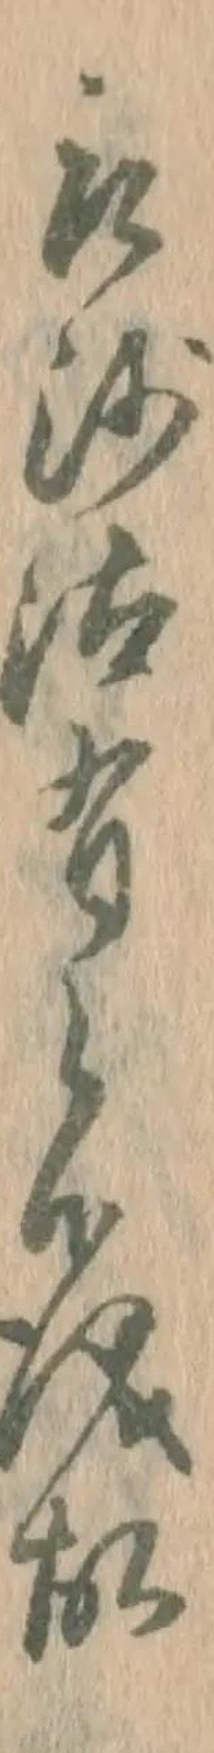被沙汰有之候儀故
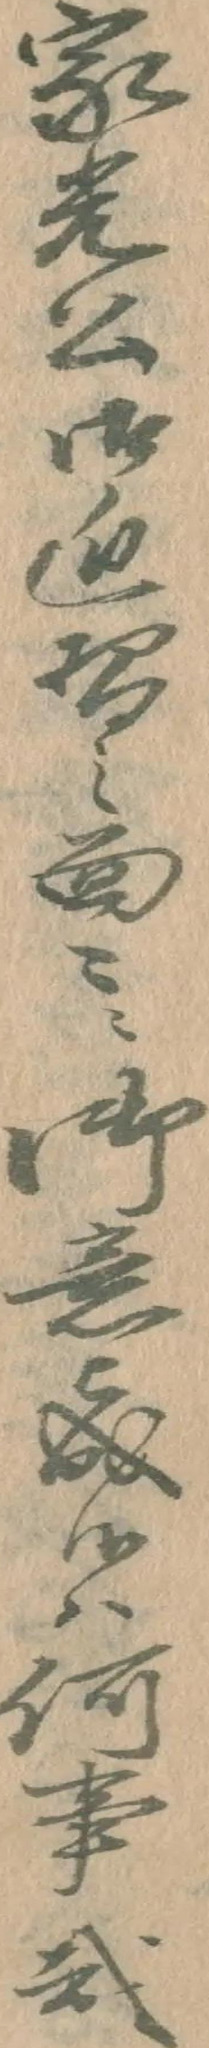家光公御近習之面々に御意被成候は何事哉
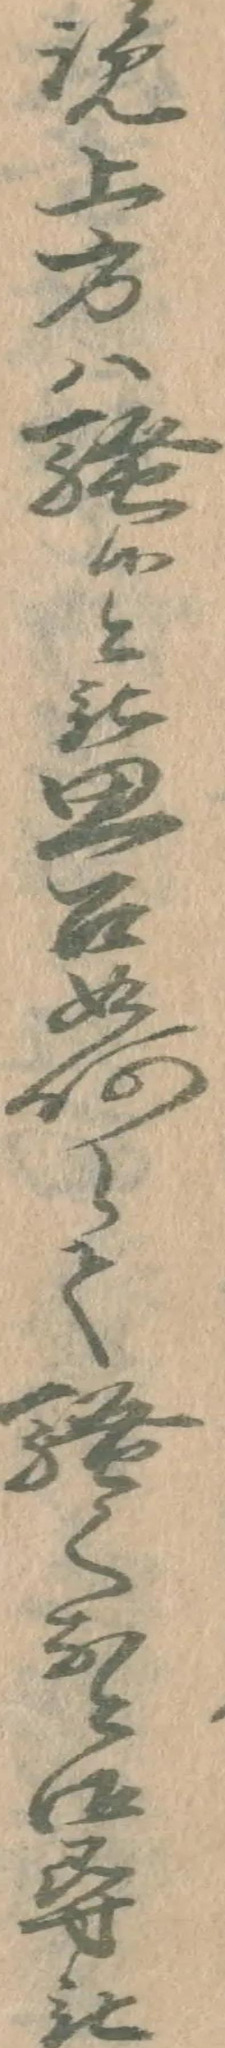覧上方は騒候と被思召如何して騒くなと御尋被
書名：切支丹御退治記 49巻. [1]
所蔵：国立国会図書館 National Diet Library, JAPAN
